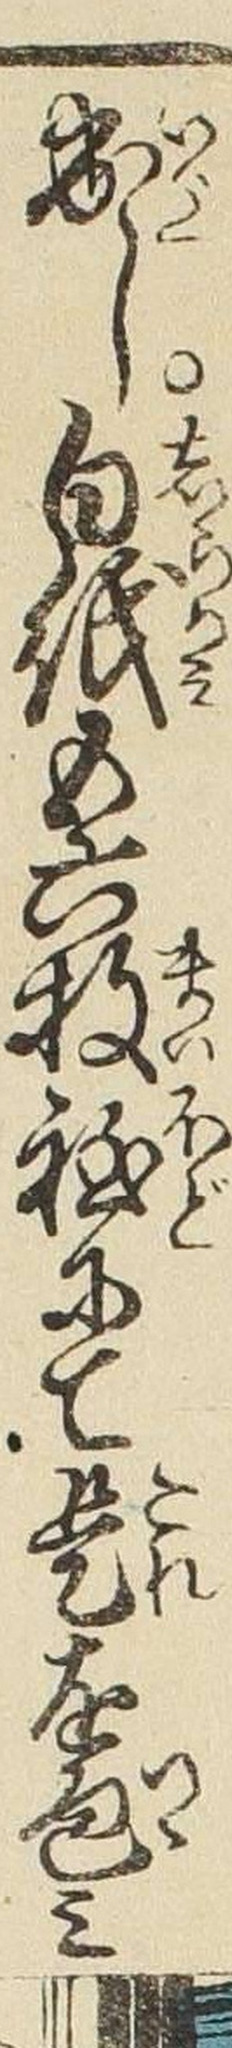出し。白紙五六枚程にて是を包み
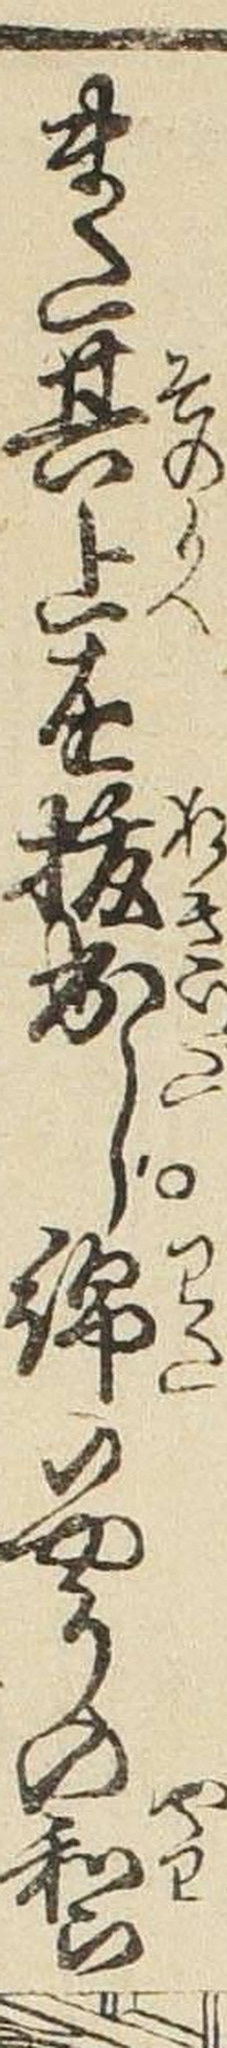また其上を抜出し。綿いやうの和ら
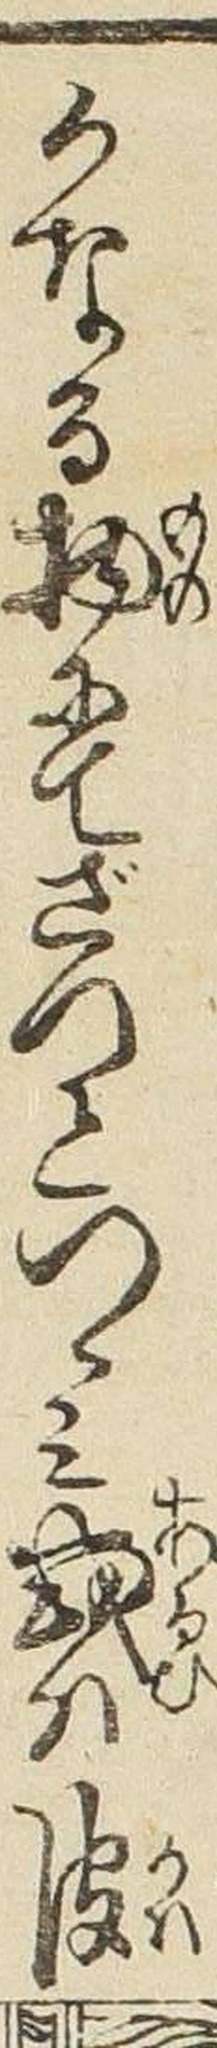かなる物にてざつとつゝみ或は皮
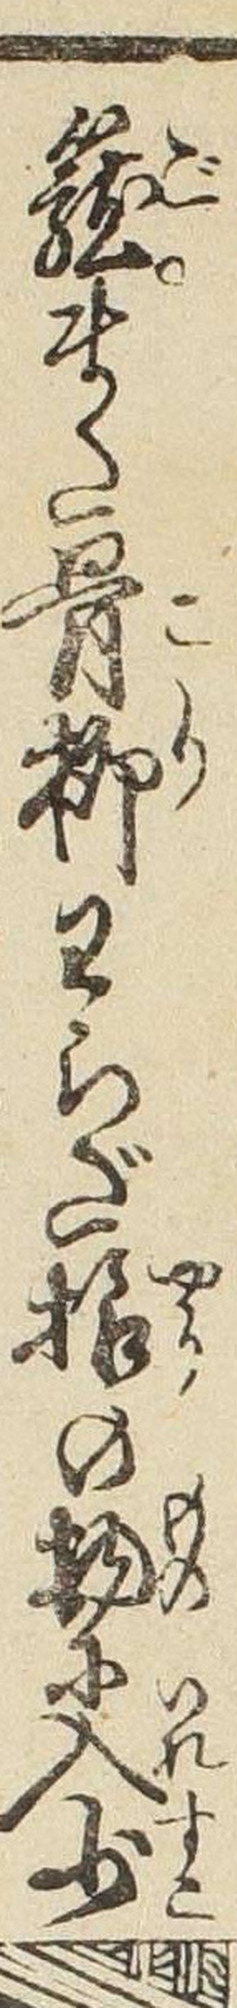籠。また骨柳わらだ様の物に入少
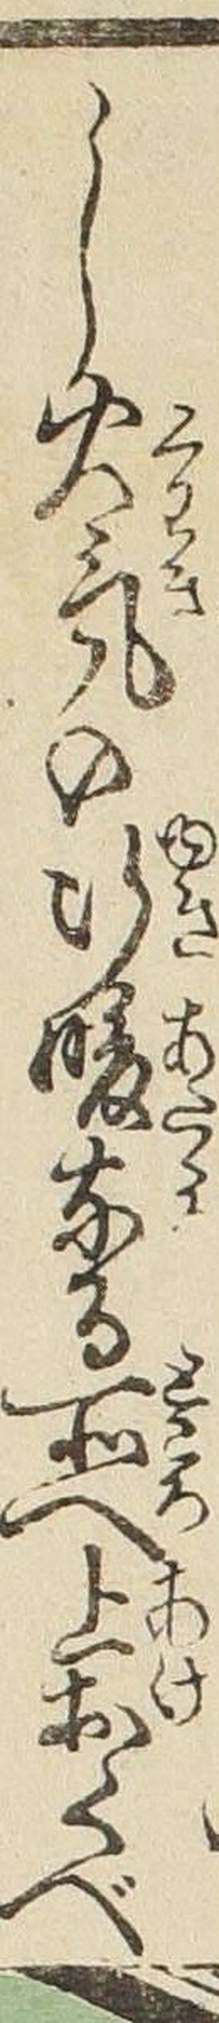し火気の行暖なる所へ上おくべ
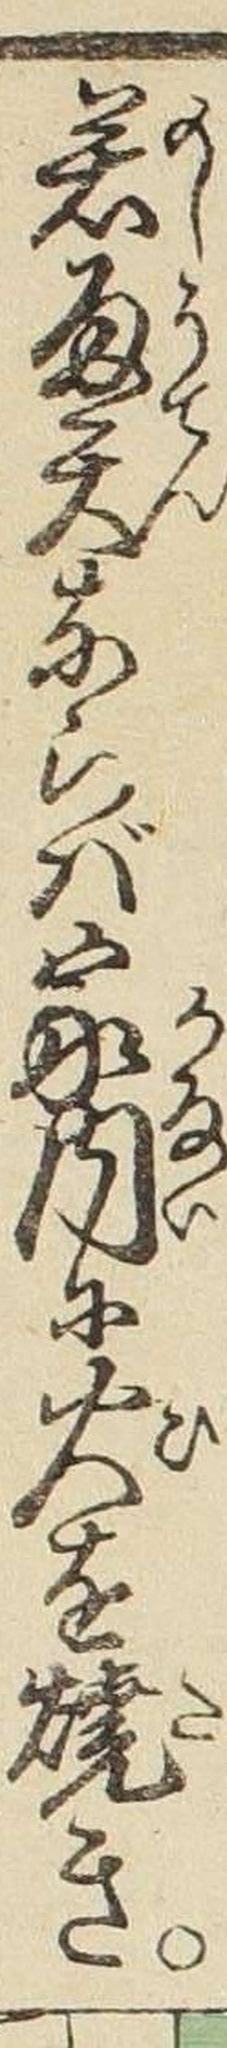若雨天ならば家内に火を焼き。
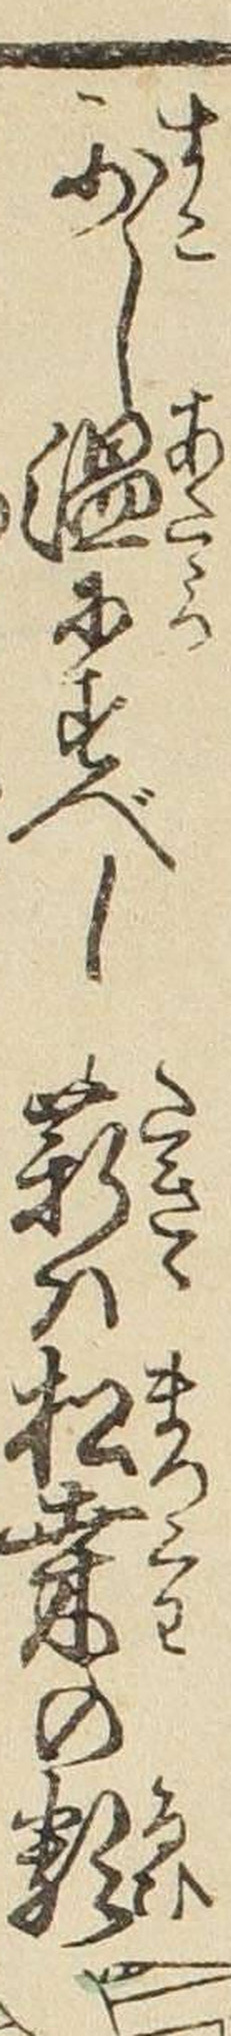少し温にすべし薪は松桑の類
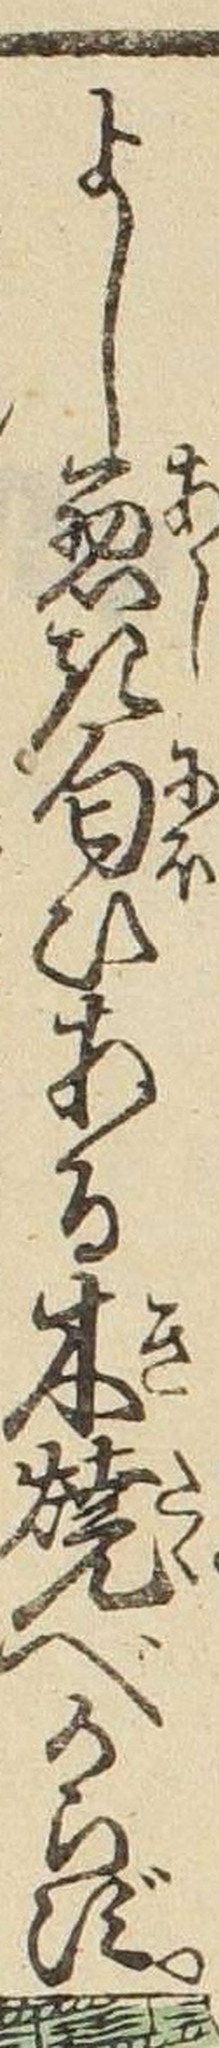よし悪き匂ひある木焼べからず。
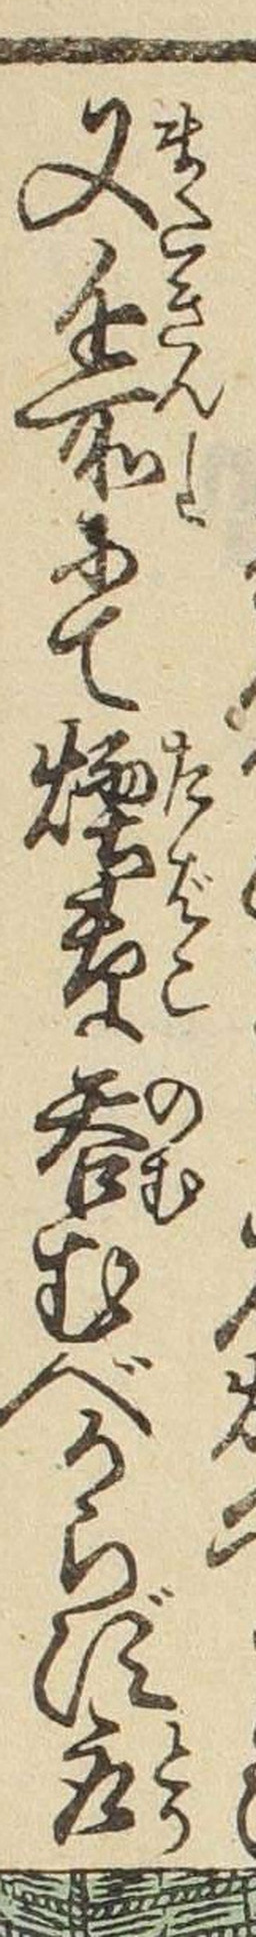又近所にて煙草呑むべからず取

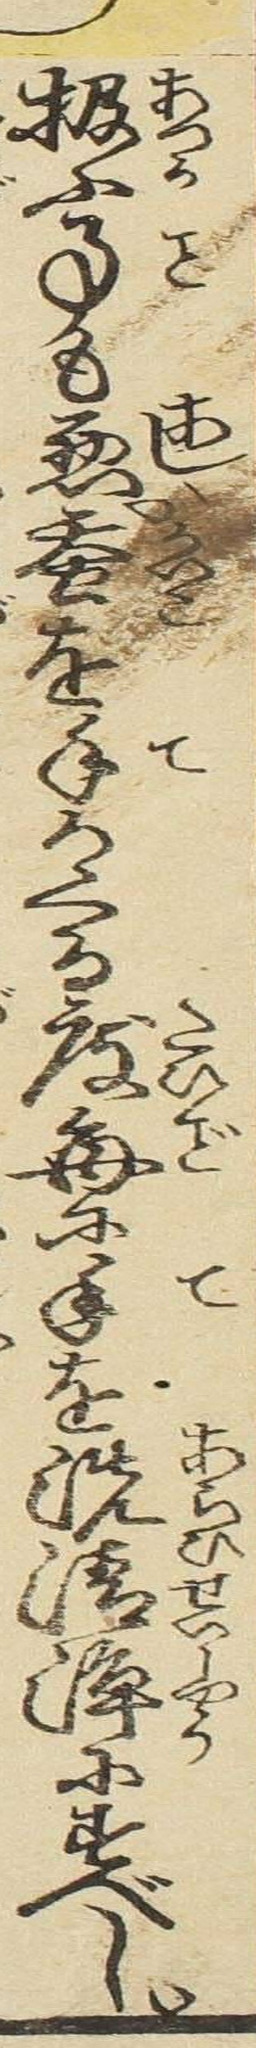扱ふ事も悪。蚕を手かくる度毎に手を洗清浄にすべし。
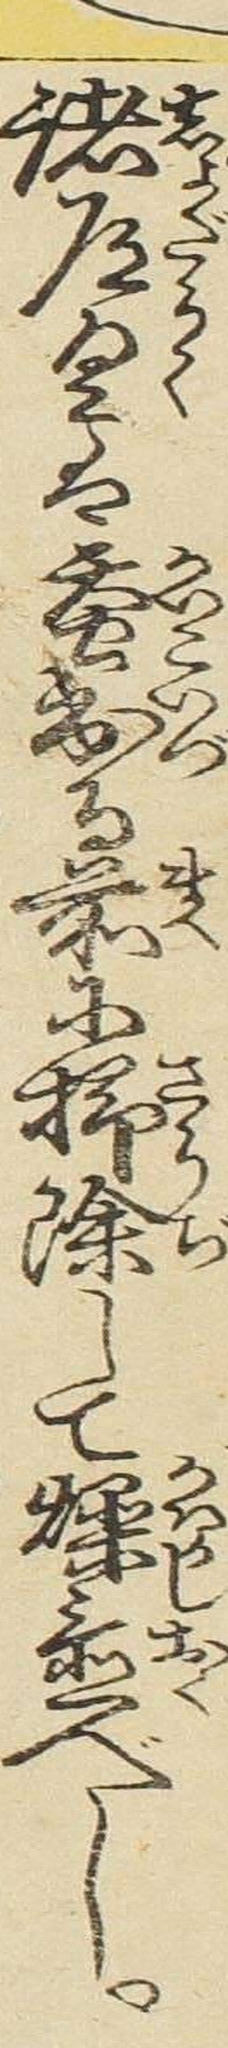諸道具は蚕出る前に掃除して燥置べし。
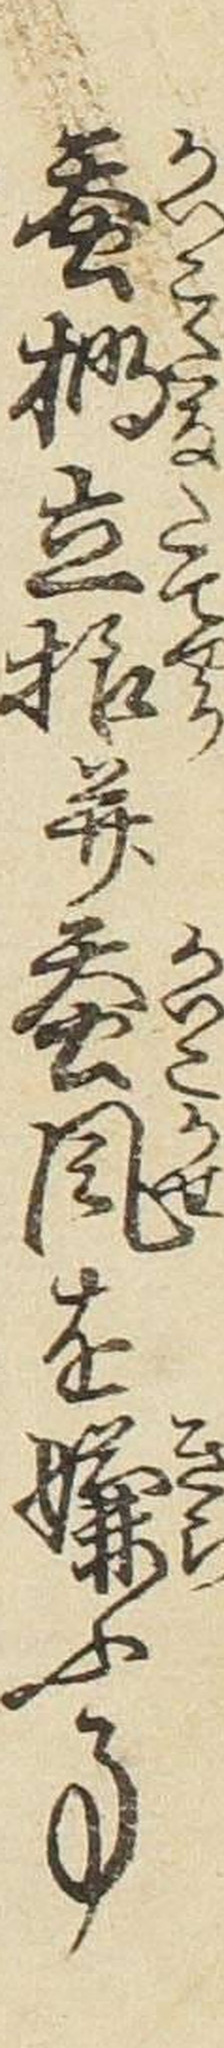蚕棚立様幷蚕風を嫌ふ事
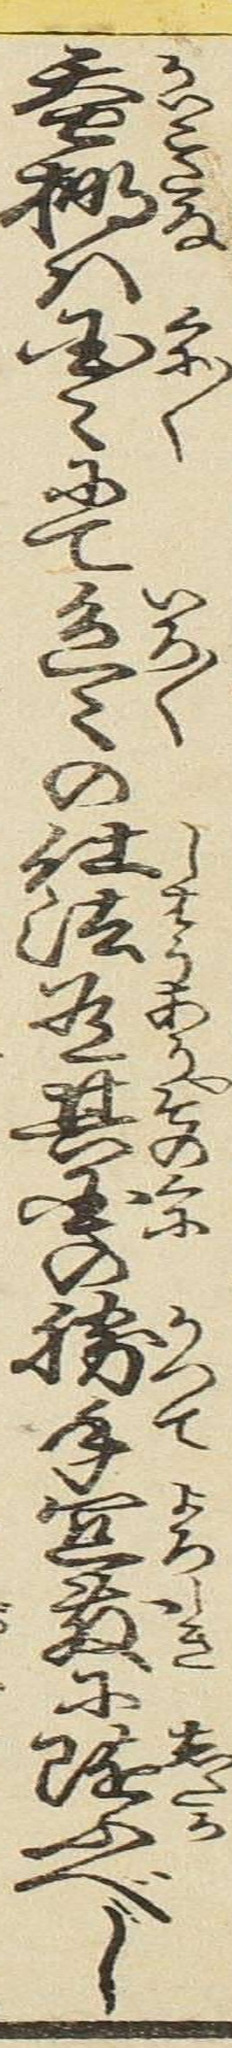蚕棚は国々にて色々の仕法有。其国の勝手宜敷に随ふべし
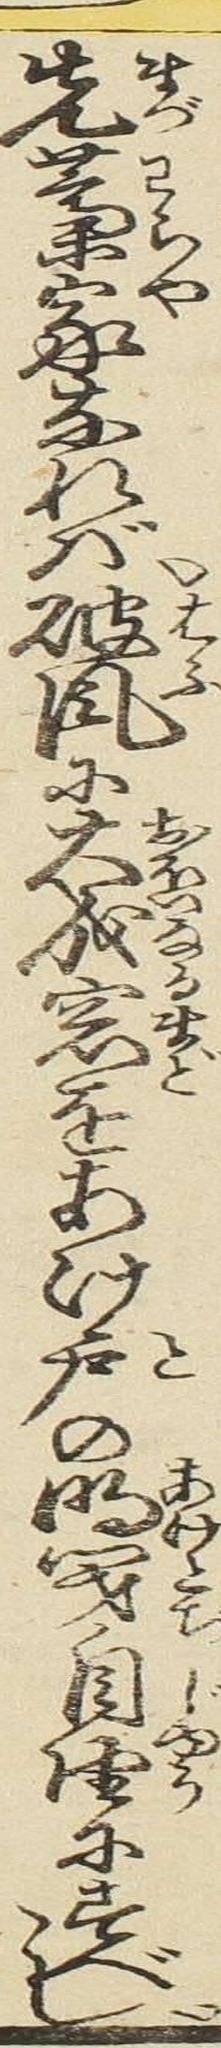先藁家なれば。破風に大成窓をあけ戸の明閉自由にすべし。
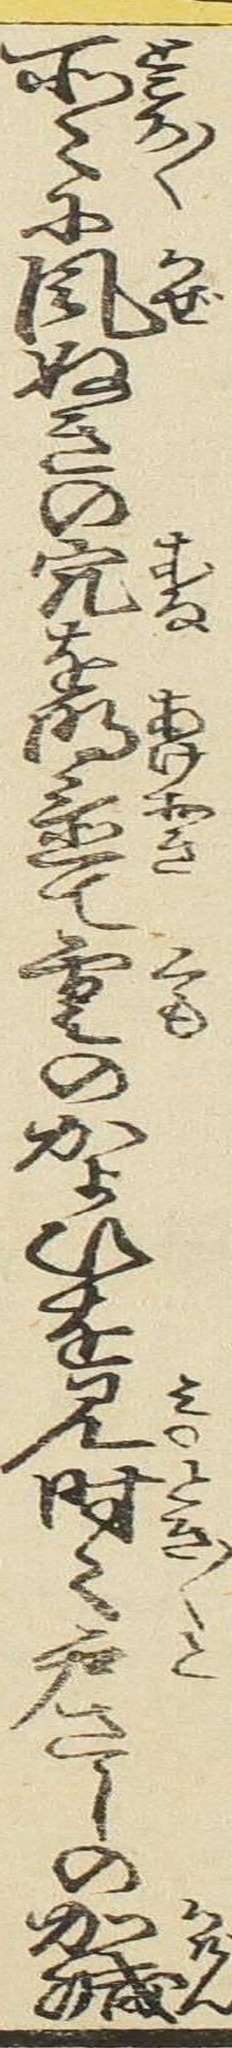所々に風ぬきの穴を明置て雲のかよひを見。時々戸さしの加減
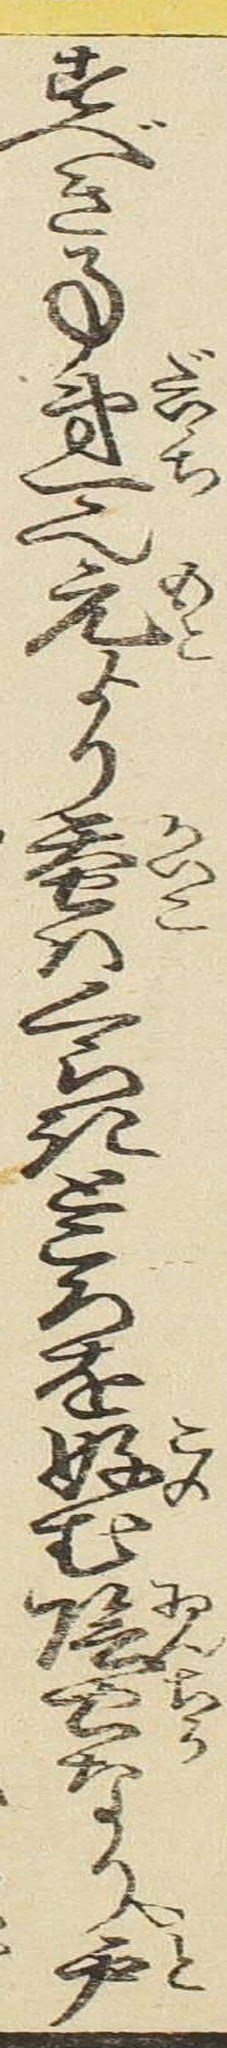すべき事第一也元より蚕はくらきところを好む陰虫なり。戸
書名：養蠶圖解
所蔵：東京大学農学生命科学図書館 国文学研究資料館
